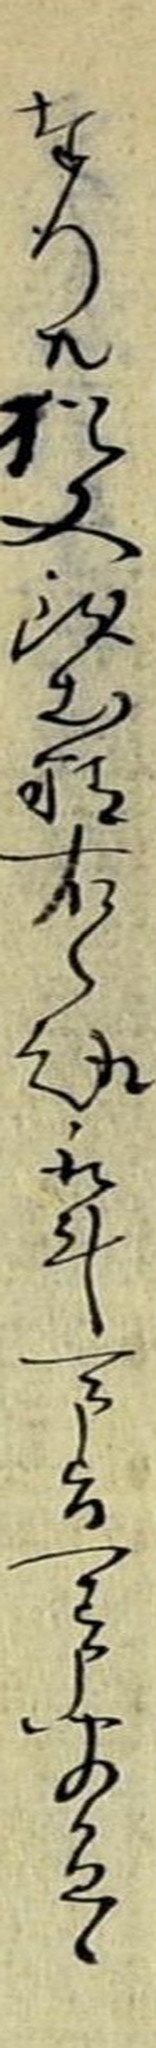奉行共猶又致出精右之趣取斗可申旨可被申聞置候
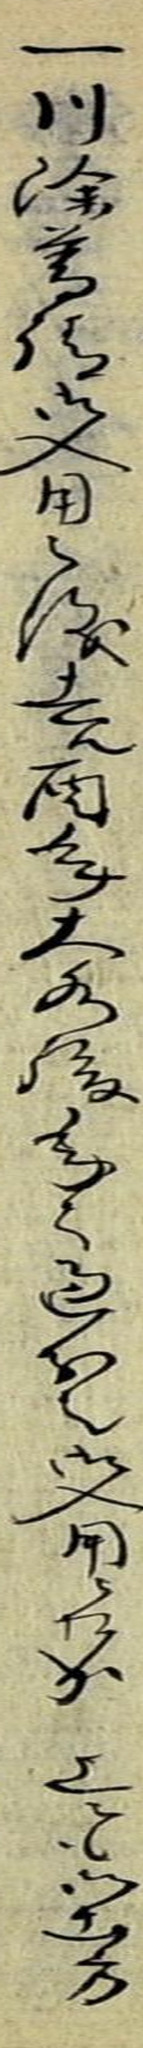一川除普請御入用之儀去る酉年大水後年々過分之御入用に相成上にも御出方
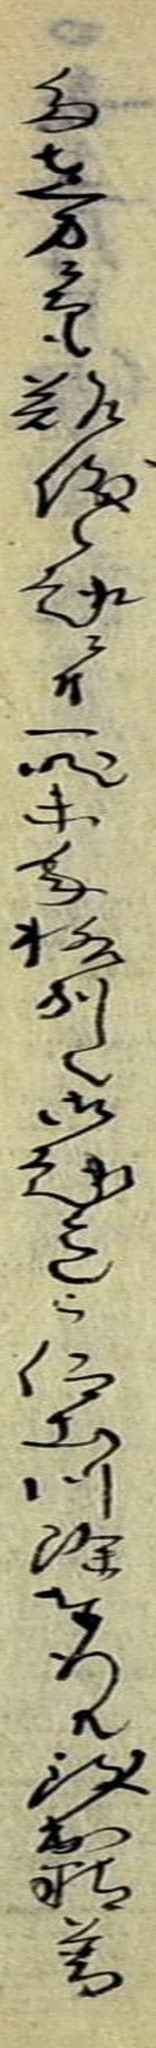多在方に而も難儀之趣に付一昨未年格別之御趣意被仰出川除奉行共致出精普
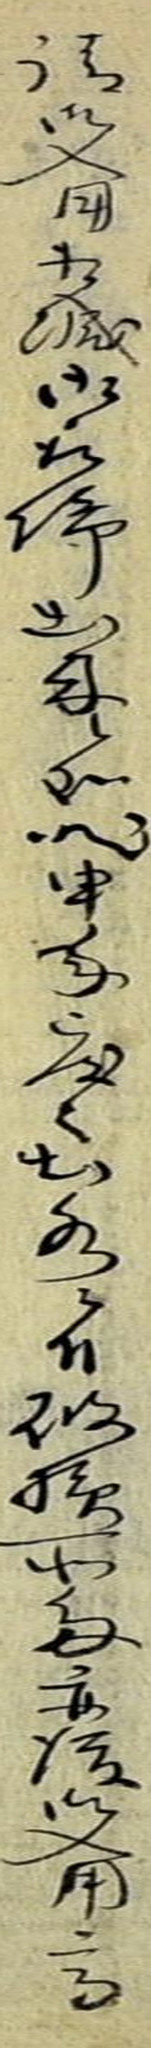請御入用相減御取締出来候処昨申年度々出水に付破損所多亦後御入用高
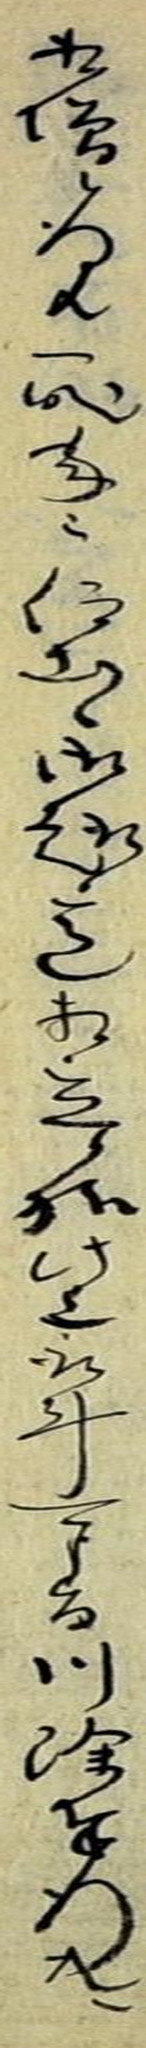相増候得共一昨年被仰出候御趣意相立候様此上取斗可申旨川除奉行共へ
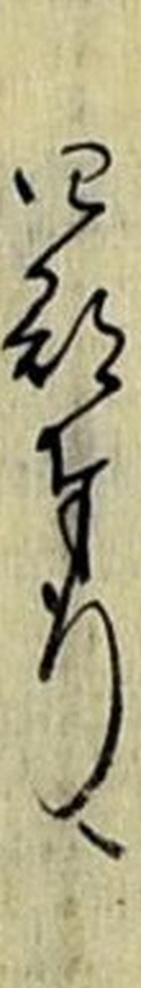四郡奉行へ
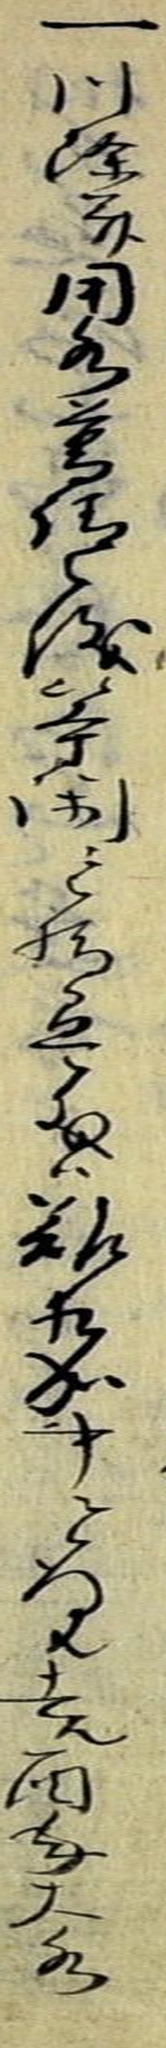一川除并用水普請之儀等閑に被指置候義は難相成事に候得共去る酉年大水
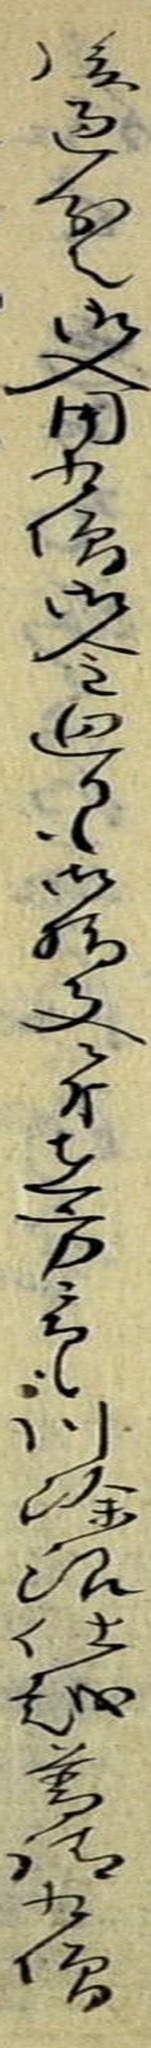後過分之御入用相増御金廻りも御指支に付在方に而も川除銀仕越普請相増
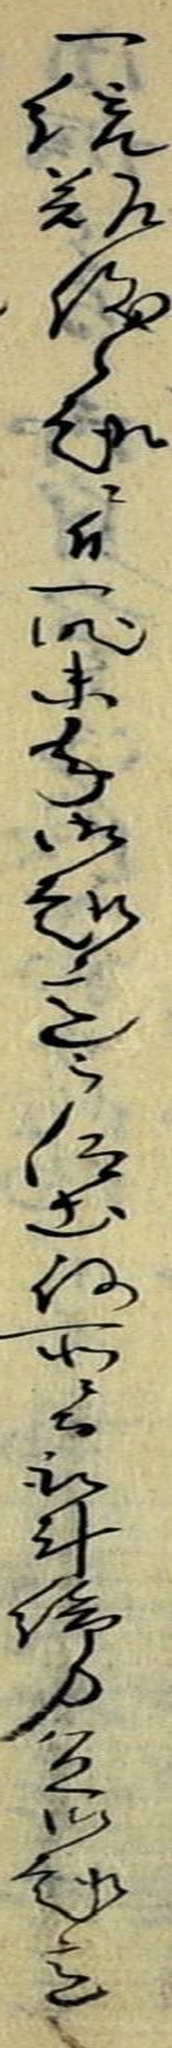一統難儀之趣に付一昨未年御趣意被仰出役所に而取斗締方宜御趣意
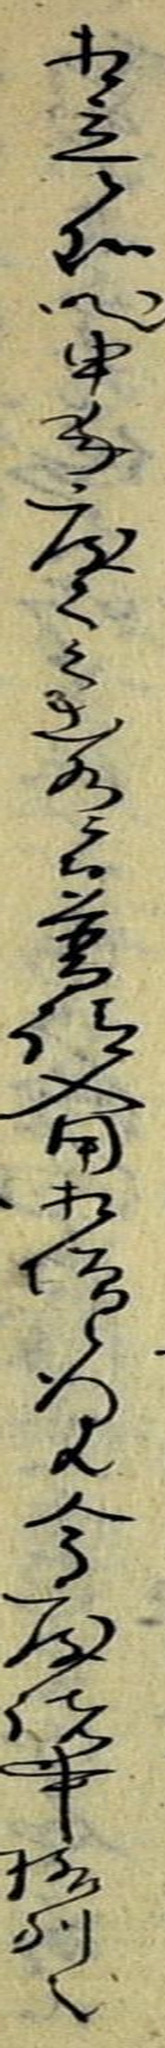相立候処昨申年度々之出水に付普請入用相増候得共今度諸事格別之
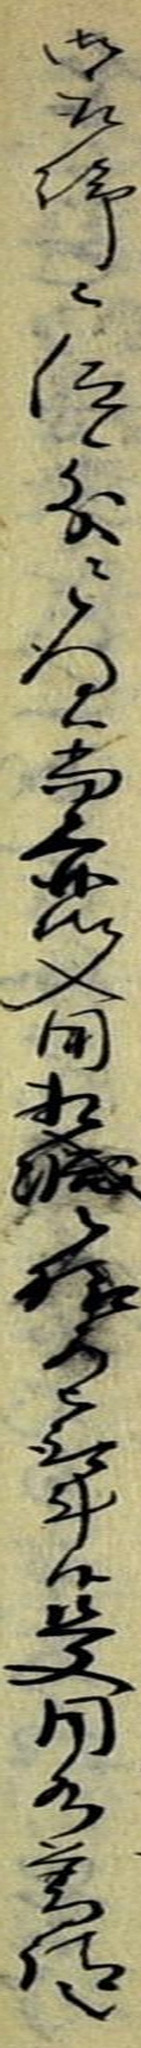御取締被仰候義に候得は尚亦御入用相減候様可被取斗候且又用水普請之
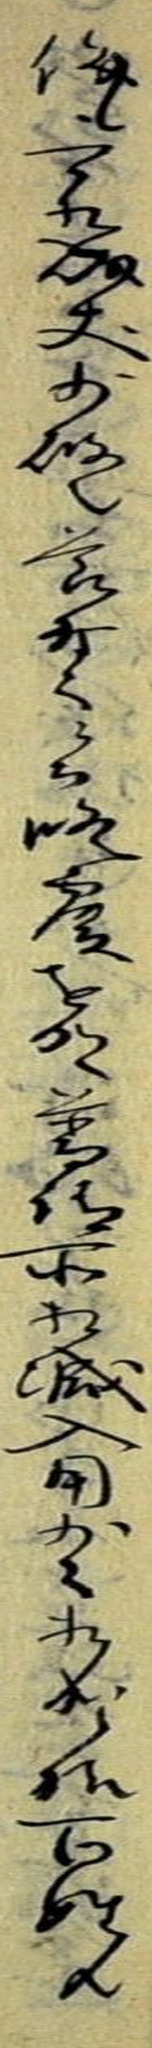儀も可相成丈少破之節村々に而修覆を加へ普請所相減入用少く相成候様百姓共
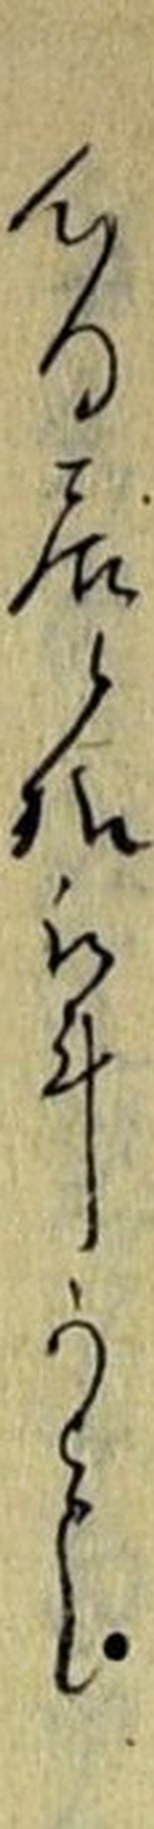心得居候様取斗可被申候
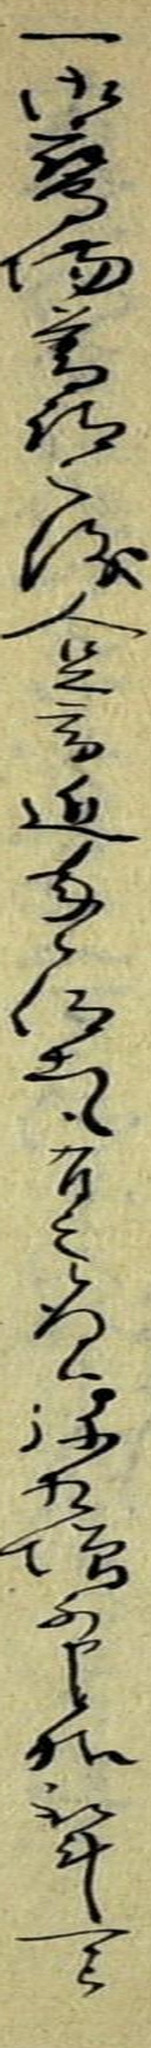一御鷹場普請之儀人足高近年被仰出も有之候得は弥相増不申様取斗可被
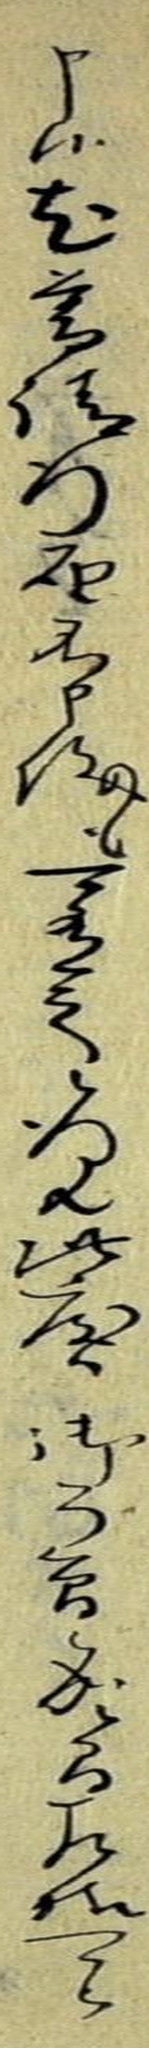申候尤普請行届不申儀も可有之候得共此度は御了簡被成候間左様可被
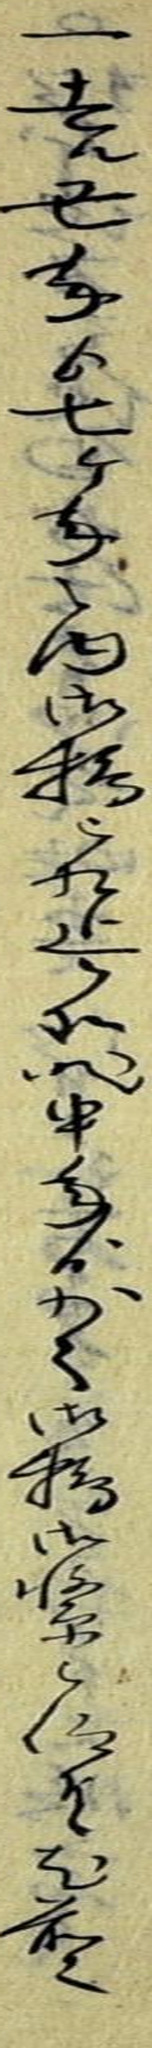一去る丑年ゟ七ヶ年之内御鵜被相止候処昨申年ゟ少々御鵜御繁被仰付候尤前々
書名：命令之部 四
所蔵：福井県文書館 Fukui Prefectural Archives
